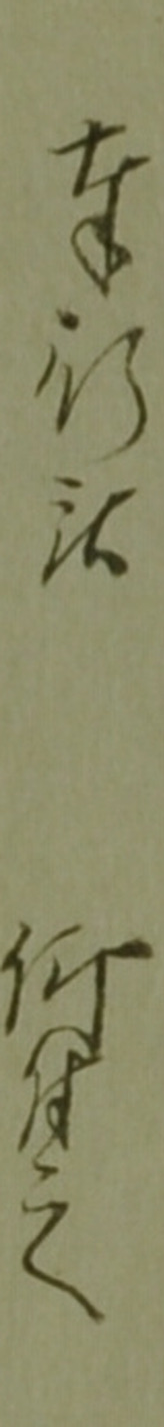奉行被仰付之

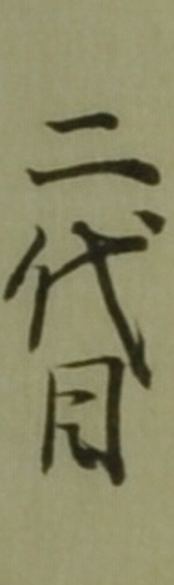二代目
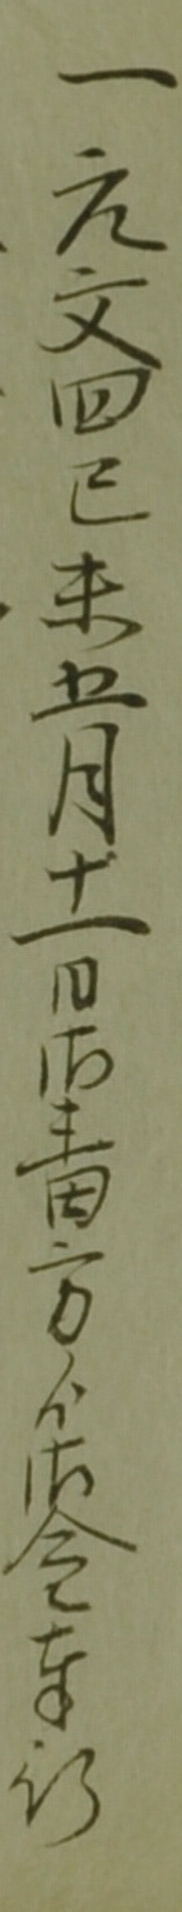一元文四己未五月十一日御番方ゟ御金奉行
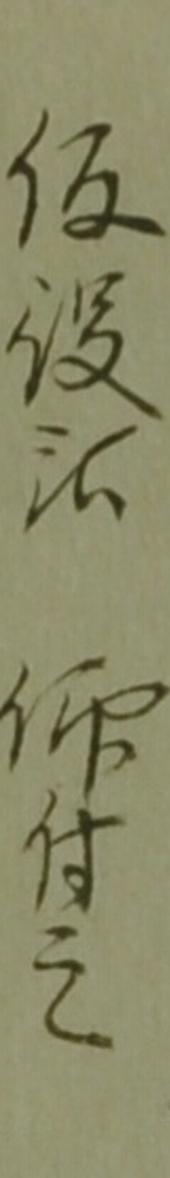仮役被仰付之
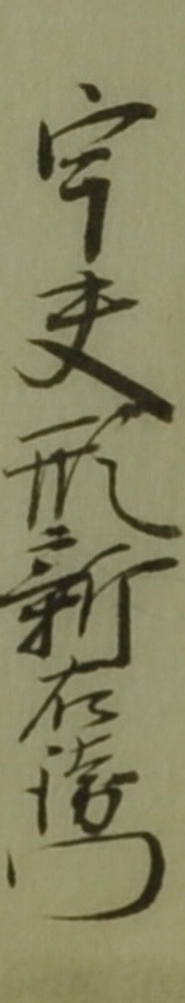宇夫形新右衛門
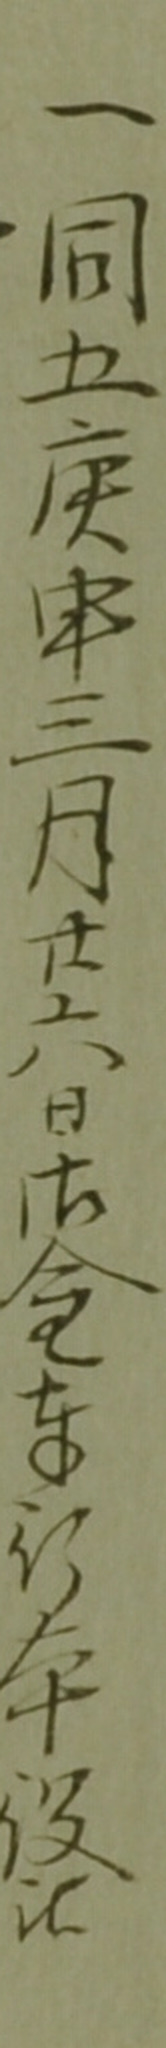一同五庚申三月廿六日御金奉行本役被
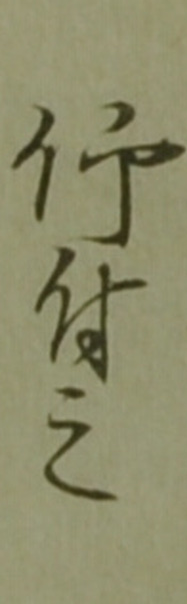仰付之
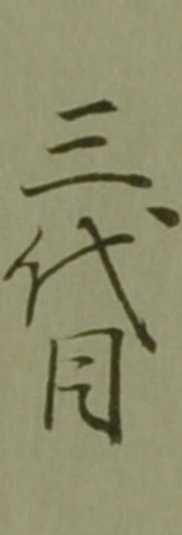三代目
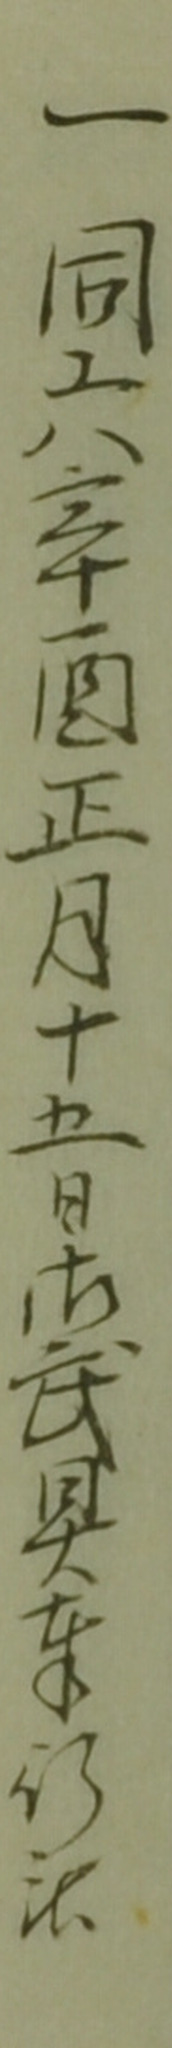一同六辛酉正月十五日御武具奉行被
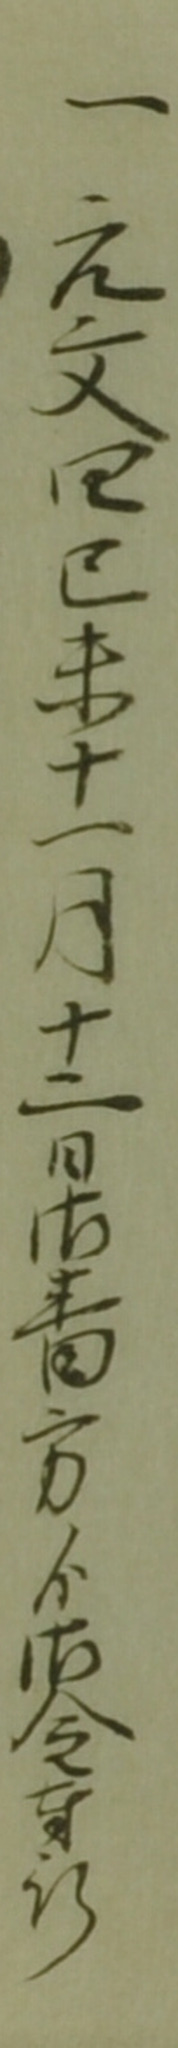一元文四己未十一月十二日御番方ゟ御金奉行
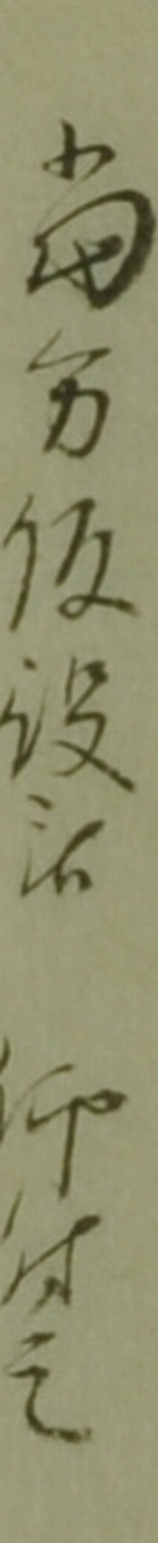当分仮役被仰付之
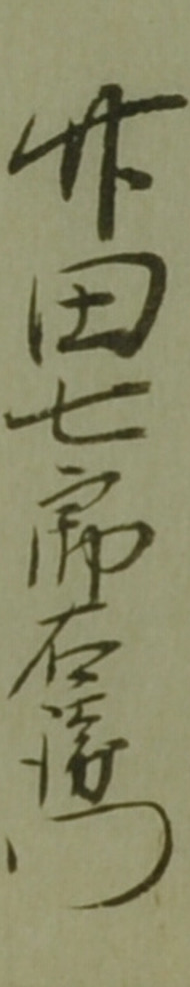竹田七郎右衛門
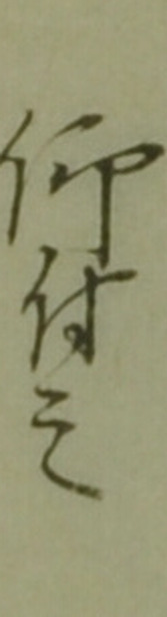仰付之
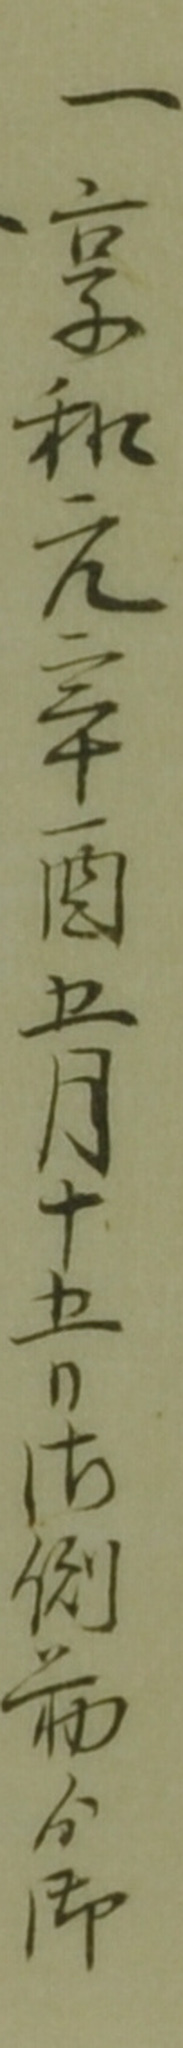一享和元辛酉五月十五日御側勤ゟ御
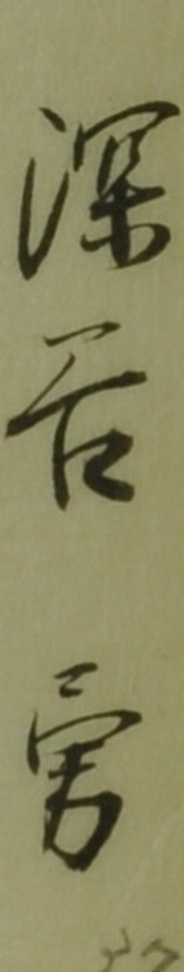深谷勇
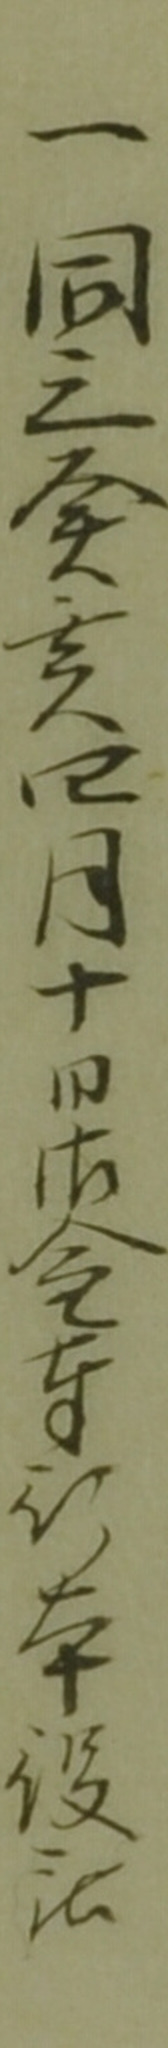一同三癸亥四月十四日御金奉行本役被
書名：諸御役代々録（七）
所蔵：伊那市立高遠町図書館・合同会社AMANE
